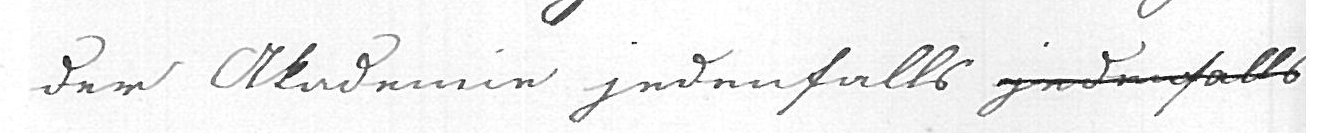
der Akademie jedenfalls jedenfalls
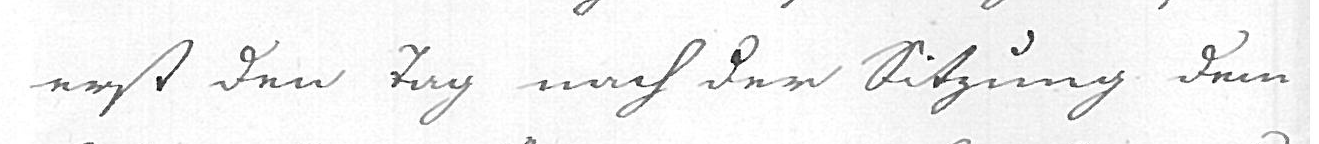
erst den Tag nach der Sitzung dem
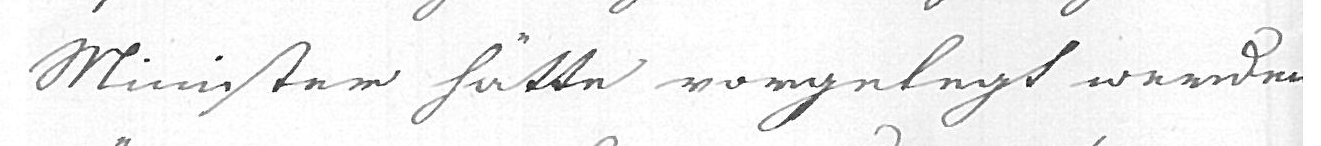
Minister hätte vorgelegt werden
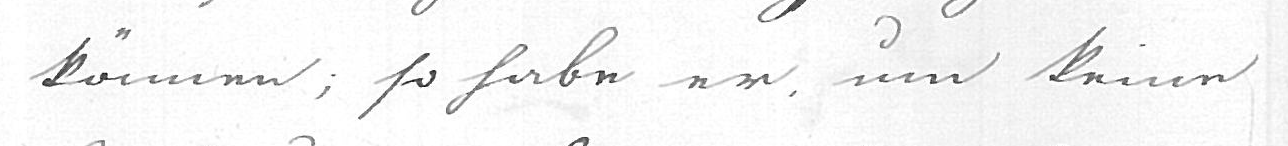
können; so habe er, um keine
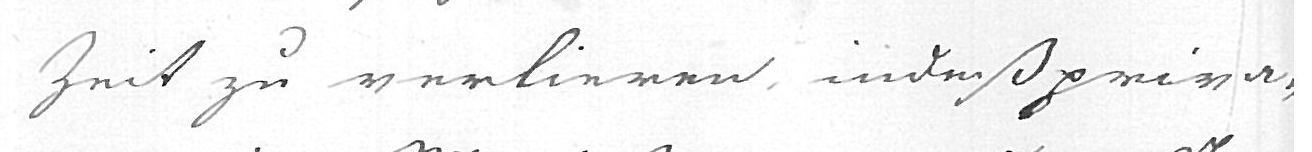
Zeit zu verlieren indeß priva-
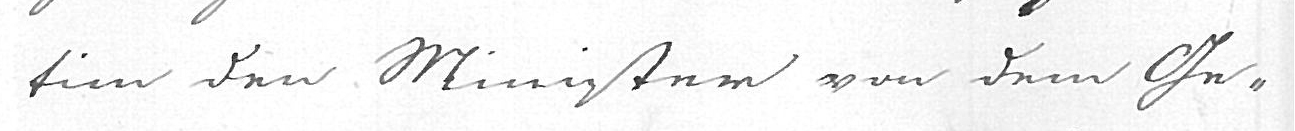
tim den Minister von dem Ge-
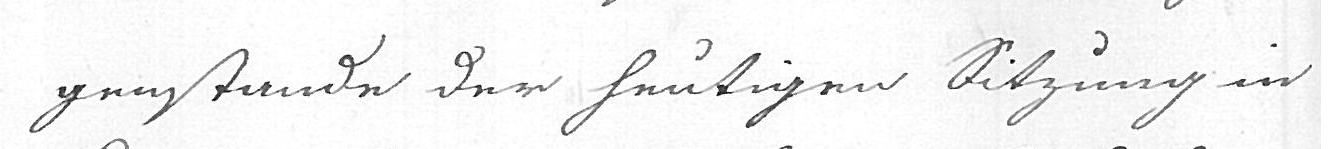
genstande der heutigen Sitzung in
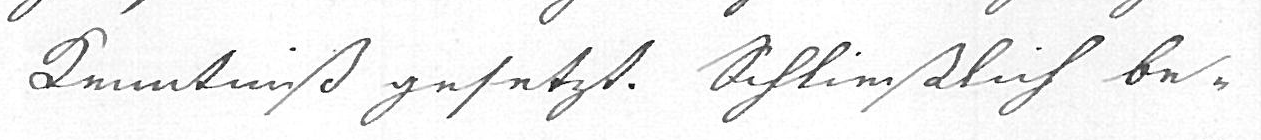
Kenntniß gesetzt. Schließlich be-
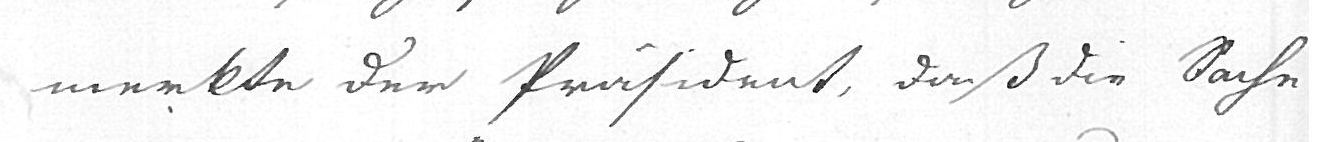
merkte der Präsident, daß die Sache
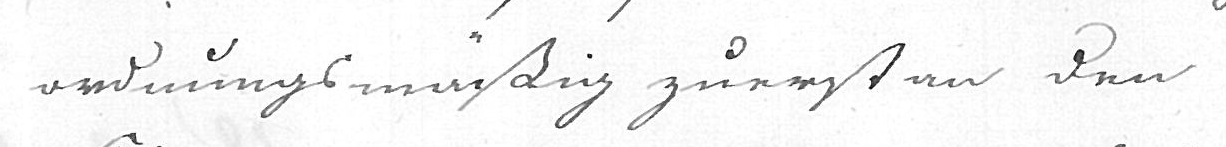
ordnungmäßig zuerst an den
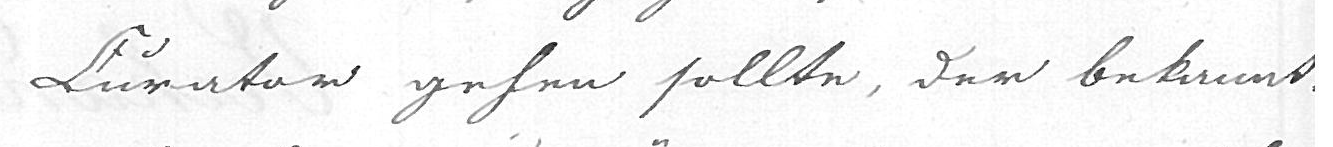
Curator gehen sollte, der bekannt-
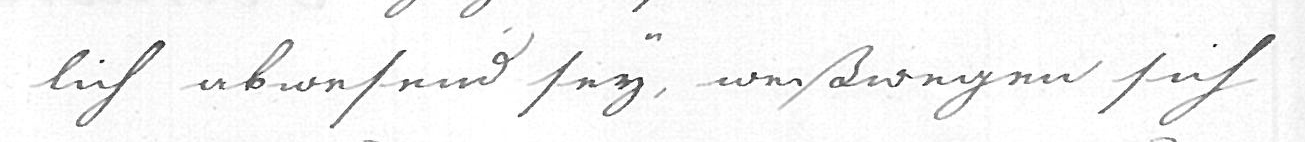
lich abwesend sey, weßwegen sich
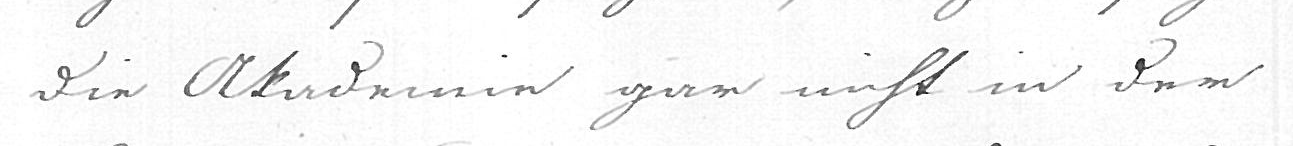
die Akademie gar nicht in der
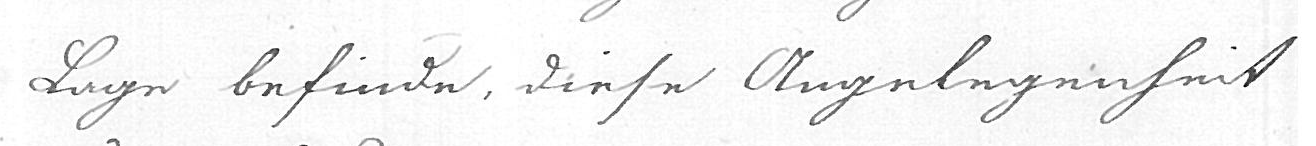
Lage befinden, diese Angelegenheit
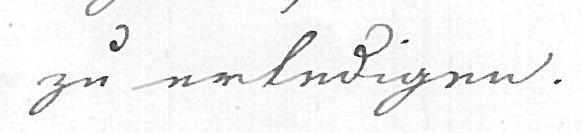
zu erledigen.
